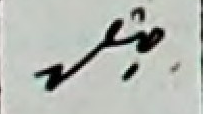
Do
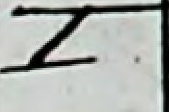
I
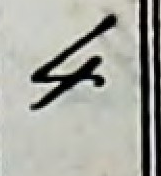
4
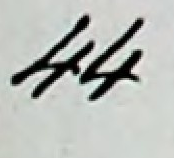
44
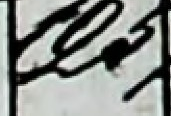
125
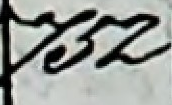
752
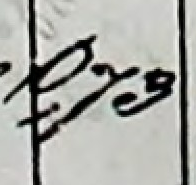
0,73
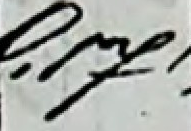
0,17
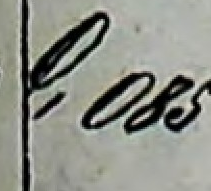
0,085
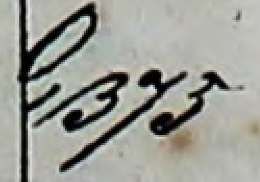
0,1375
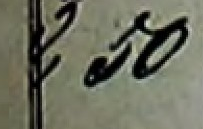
3,50
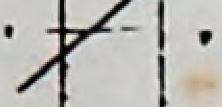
7
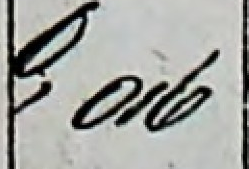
0,016
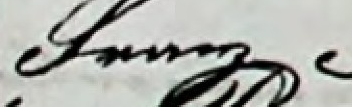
Franz
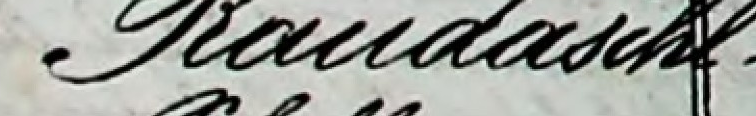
Raudaschl
